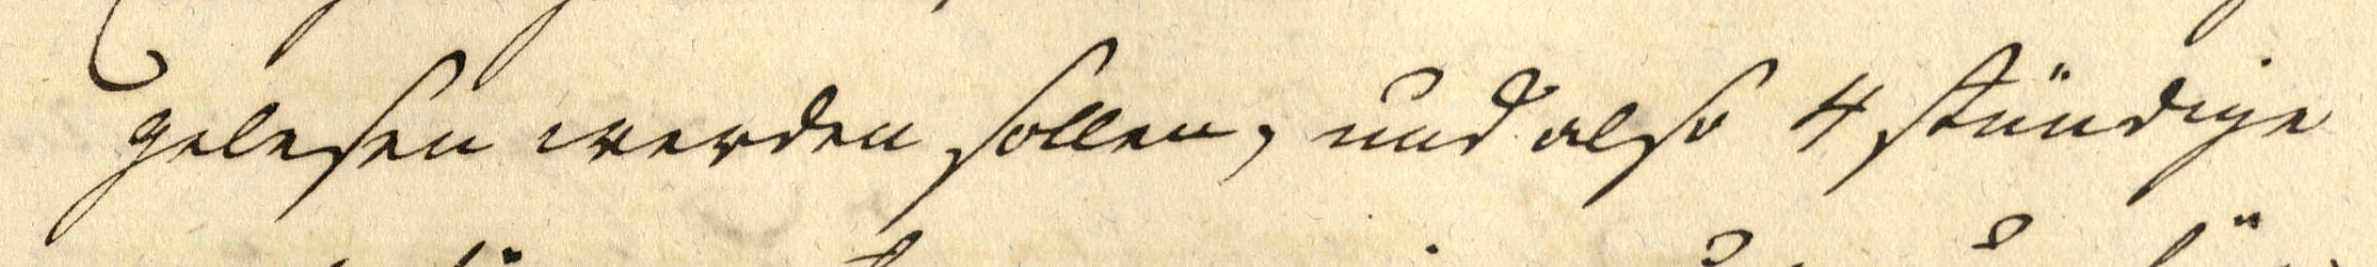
gelesen werden sollen, und also 4 stündige
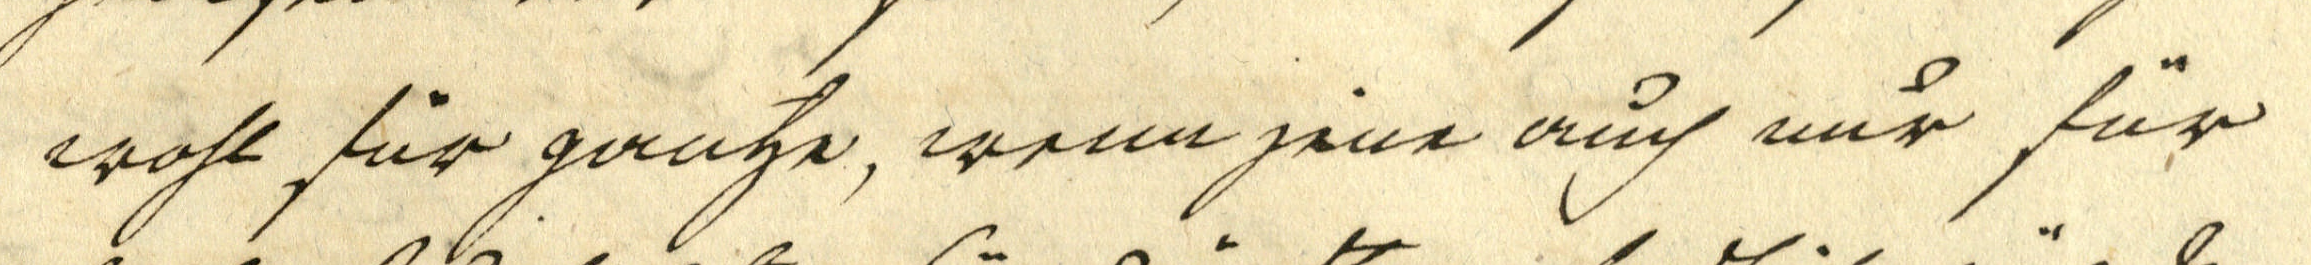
wohl für gantze, wenn jene auch nur für
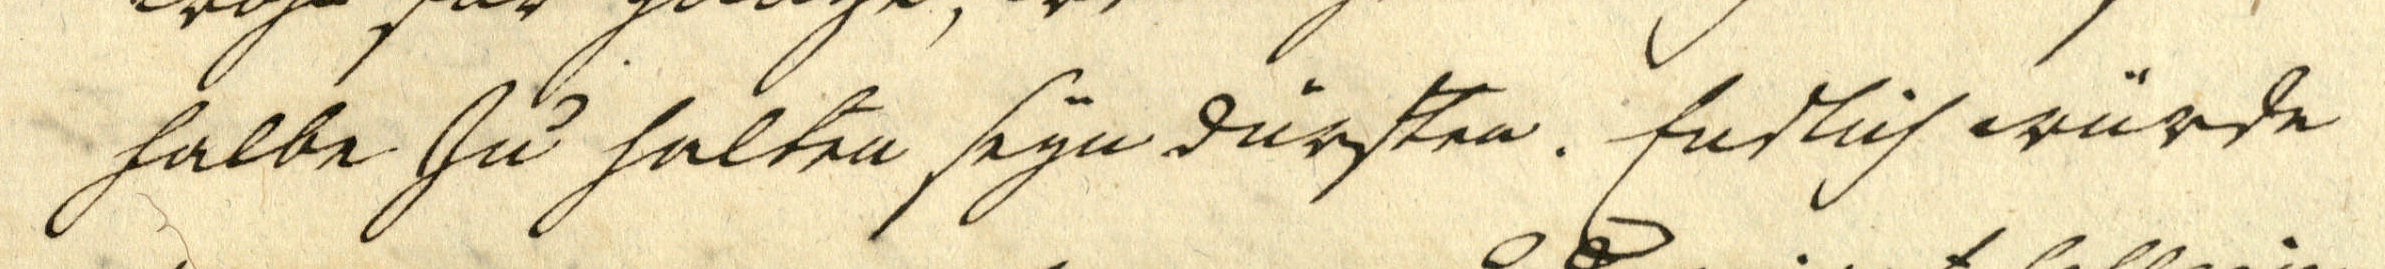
halbe zu halten seÿn dürften. Endlich würde
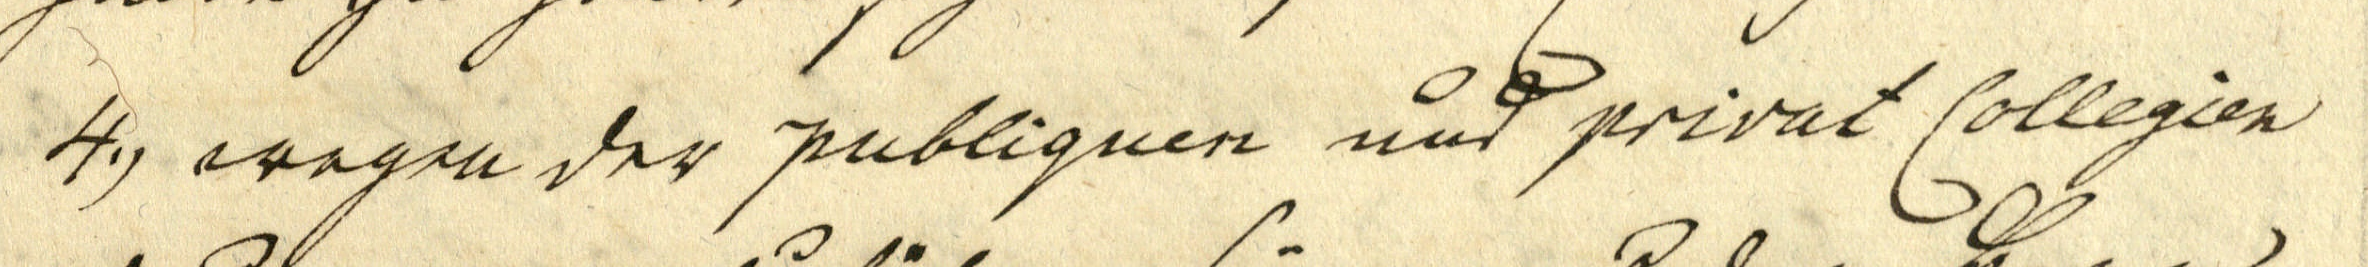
4., wegen der publiquen und privat Collegien
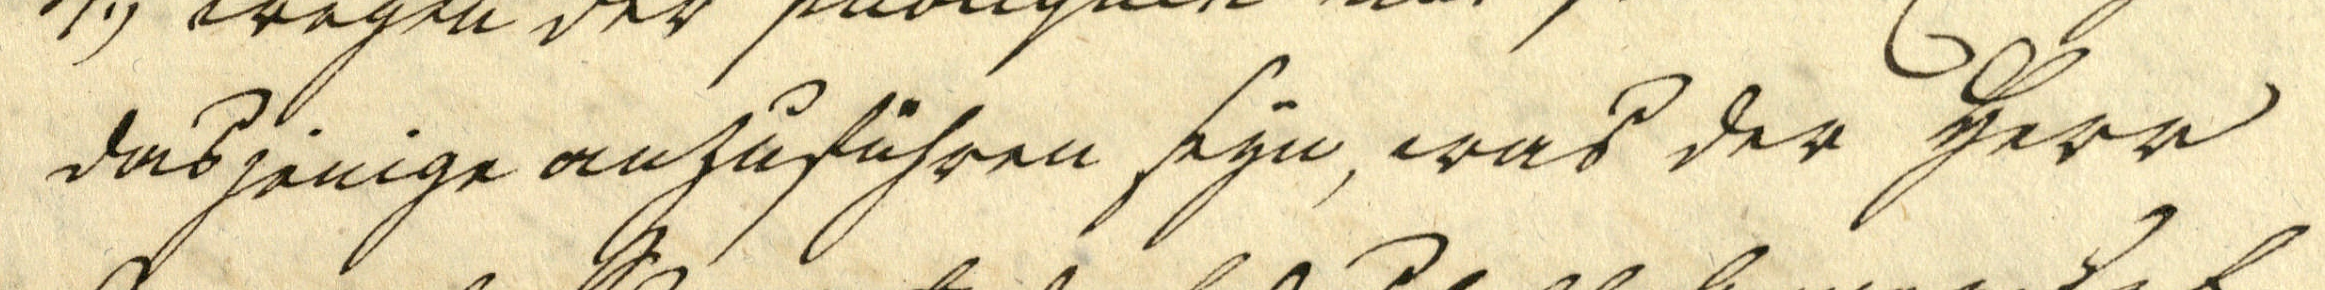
dasjenige anzuführen seÿn, was der Herr
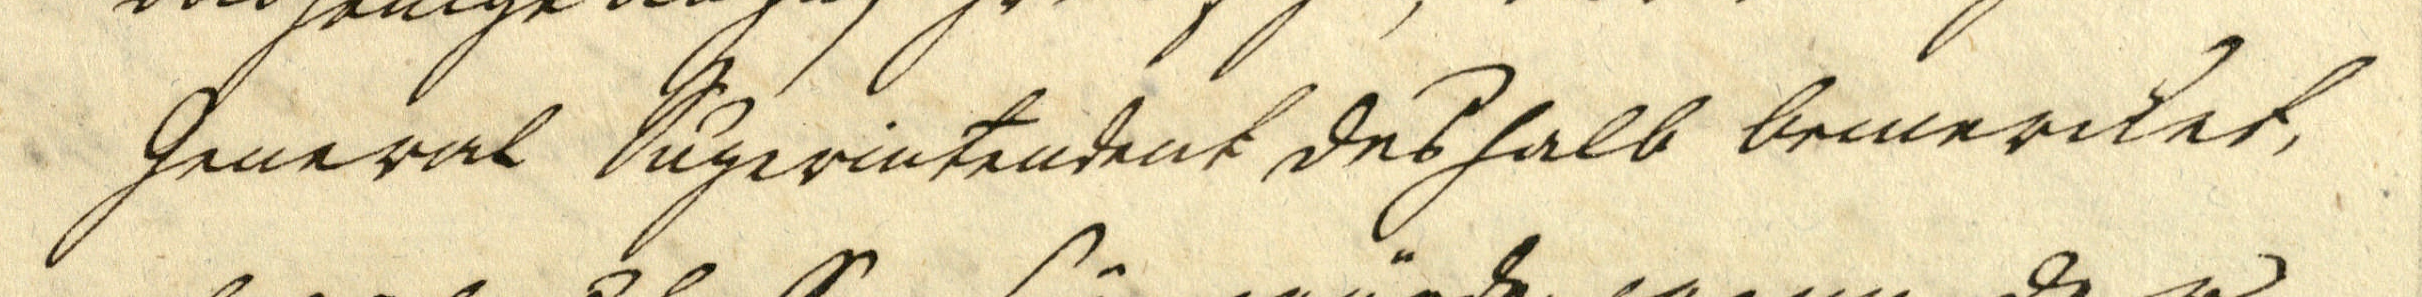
General Superintendent deshalb bemercket,
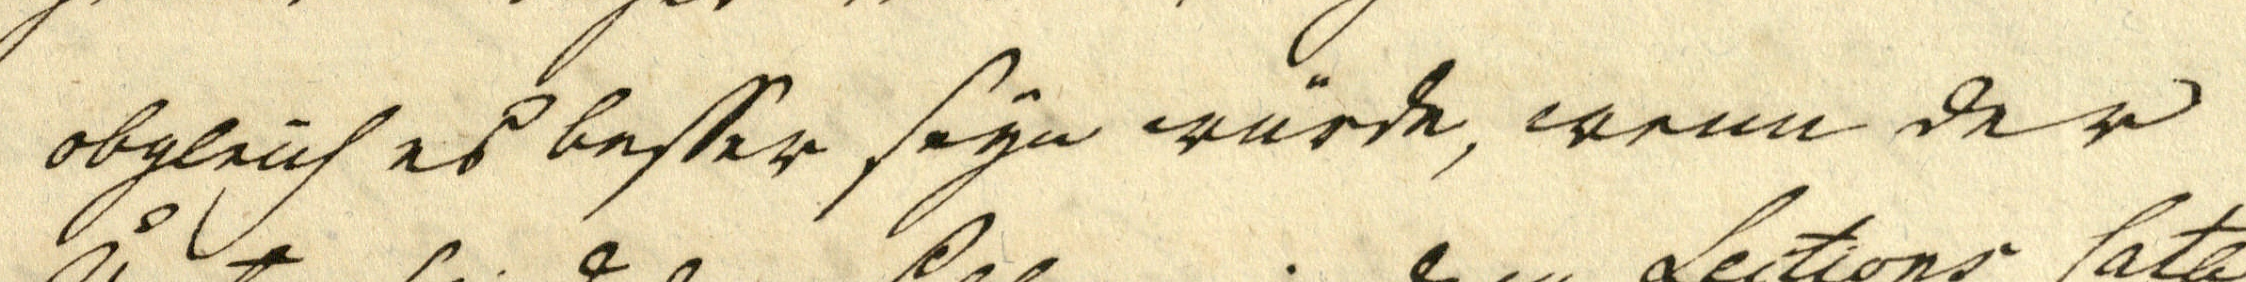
obgleich es besser seÿn würde, wenn der
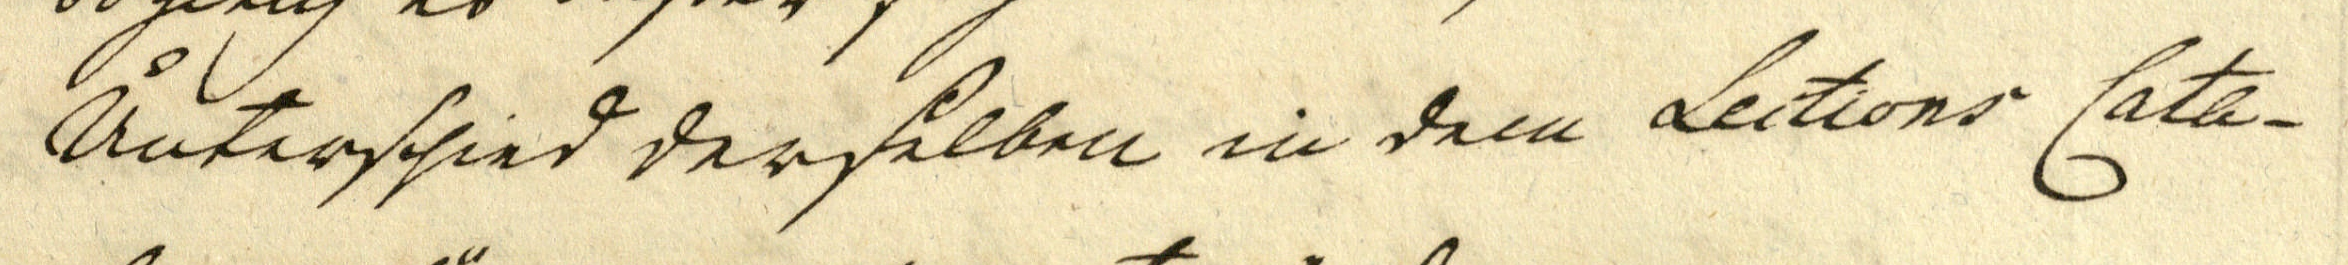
Unterschied derselben in dem Lections Cata¬
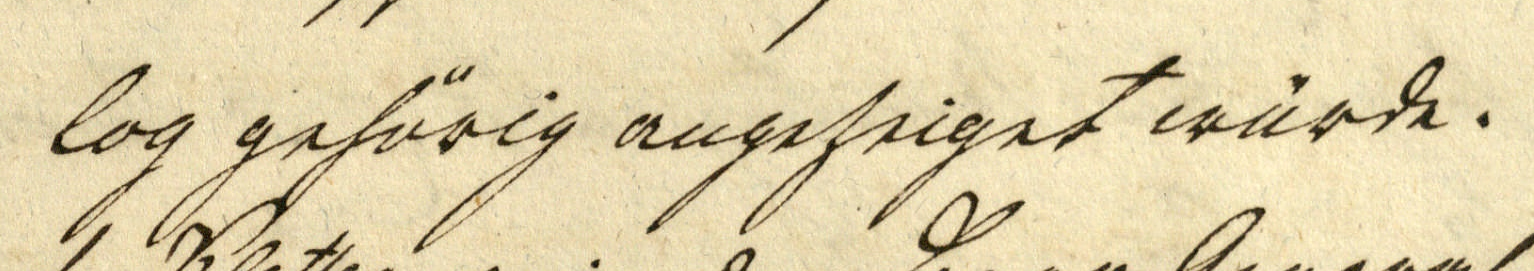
log gehörig angezeiget würde.
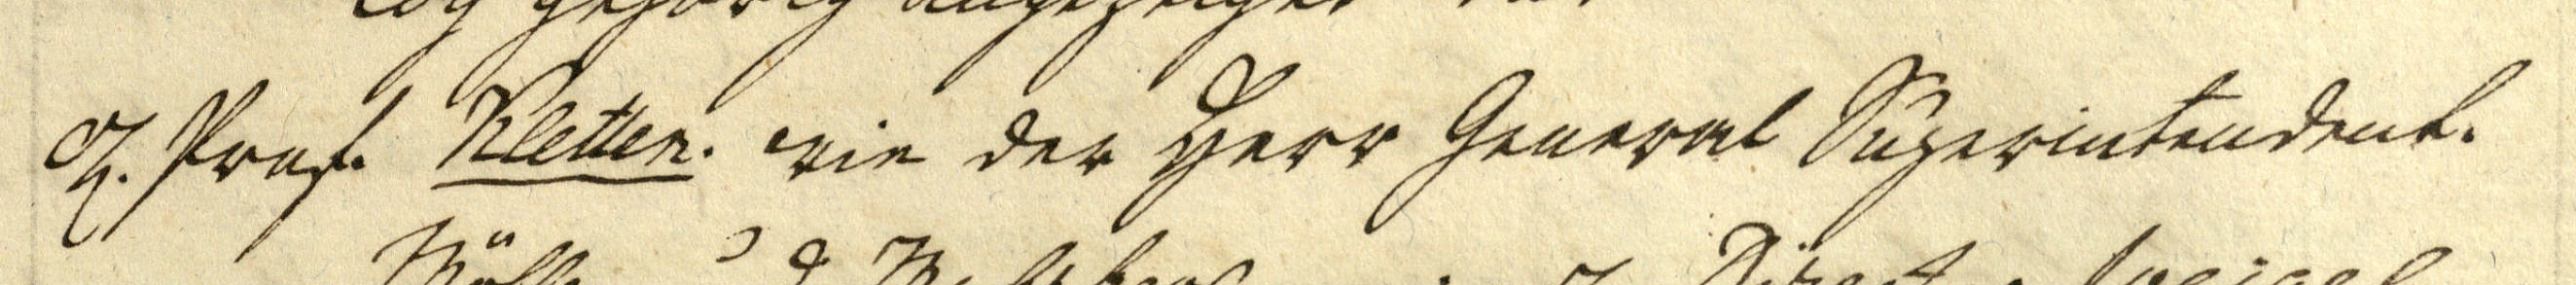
dh Prof. Kletten. wie der Herr General Superintendent.
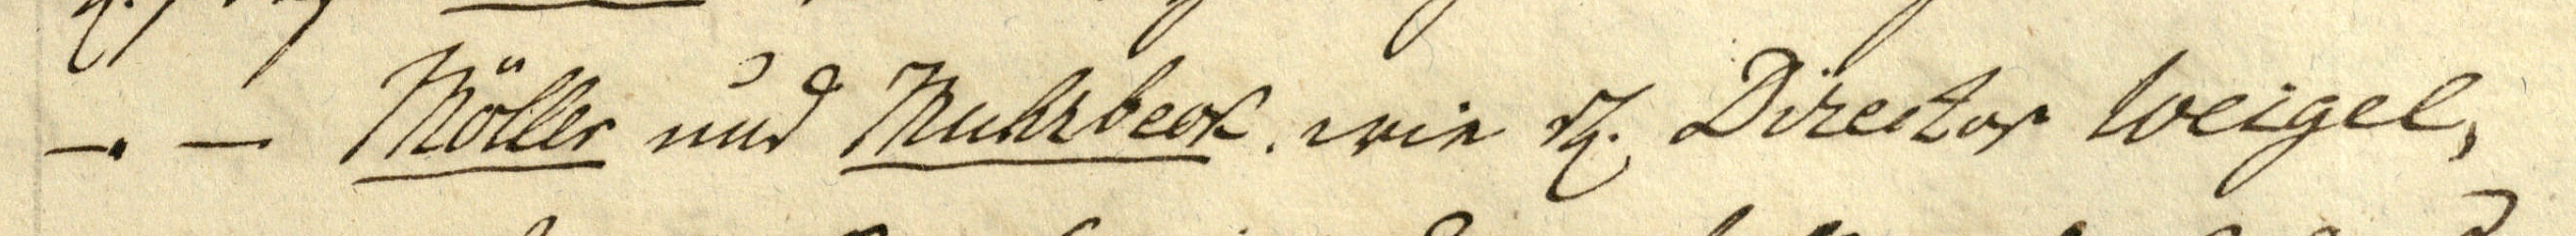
Möller und Muhrbeck wie dh. Director Weigel,
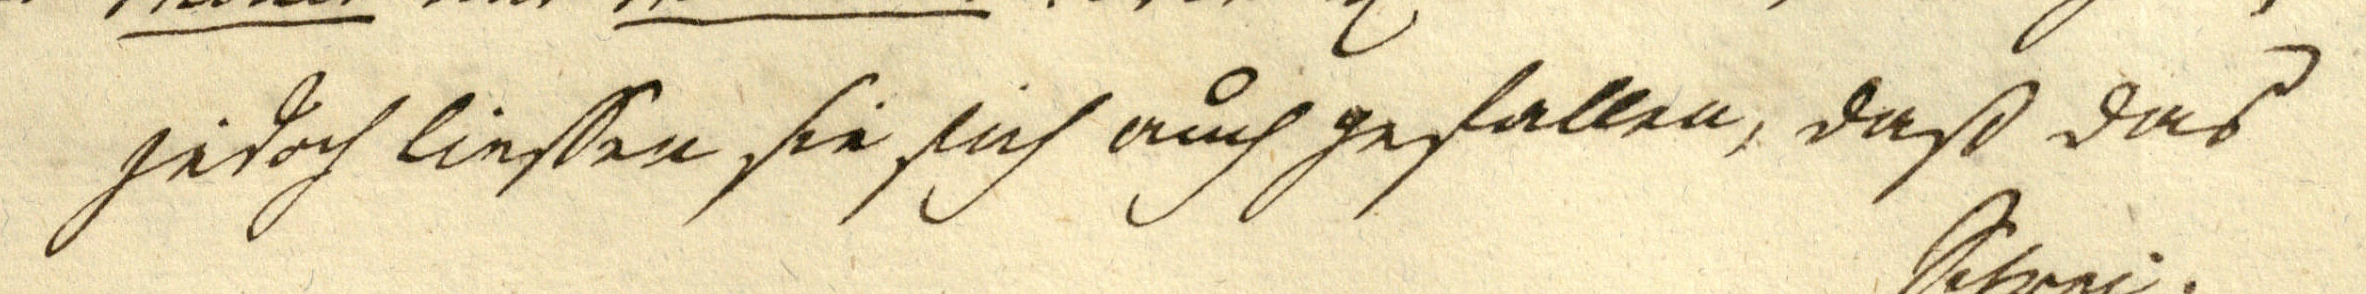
jedoch liessen sie sich auch gefallen, daß das
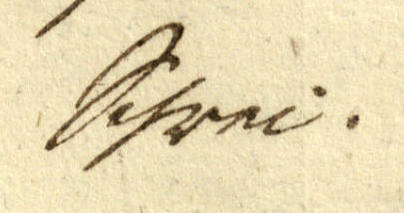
Schrei.
